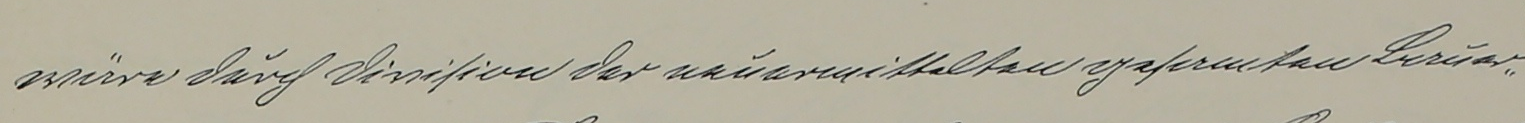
wäre durch Division der neuermittelten gesamten Bauer-
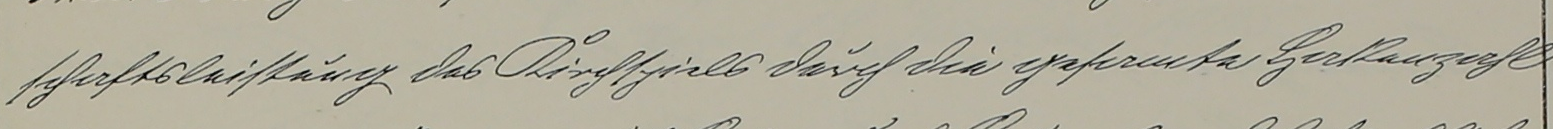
schaftsleistung des Kirchspiels durch die gesamte Hakenzahl
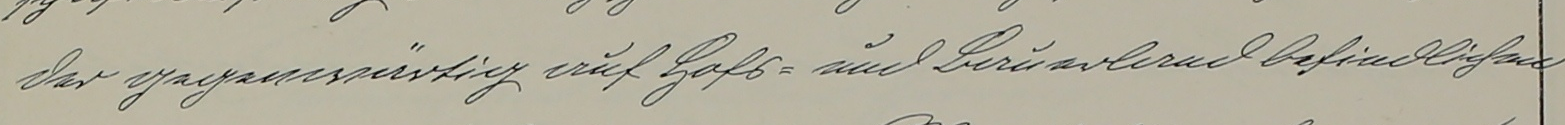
der gegenwärtig auf Hofs- und Bauerland befindlichen
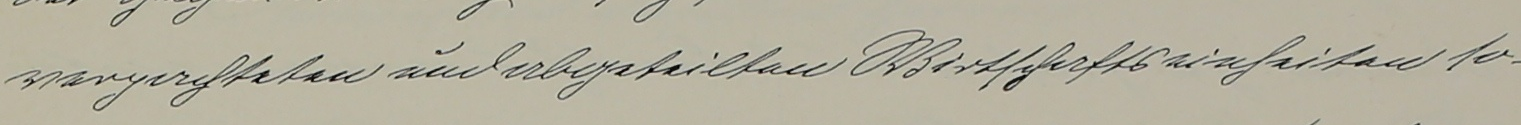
verpachteten und abgeteilten Wirtschaftseinheiten so-
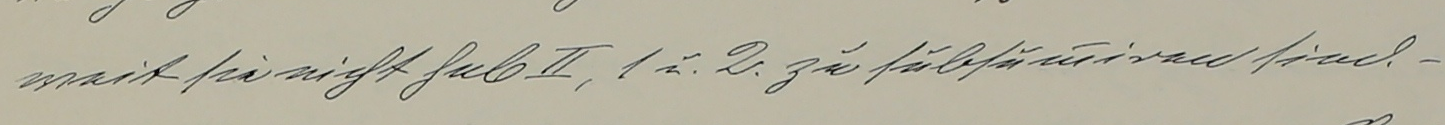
weit sie nicht sub II.1 u. 2. zu subsummiren sind.
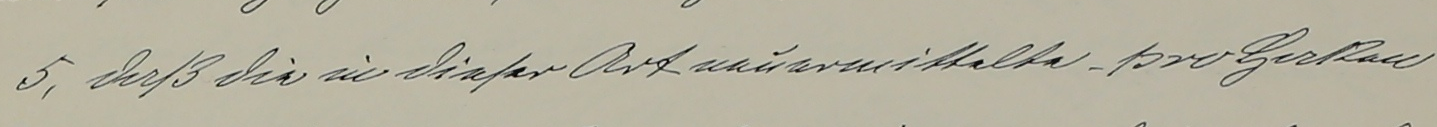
5. daß die in dieser Art neuermittelte – pro Haken
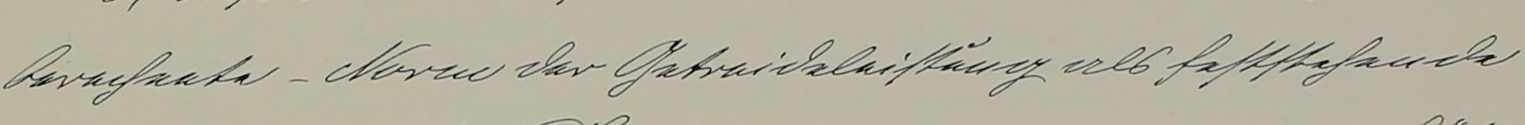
berechnete – Norm der Getreideleistung als feststehende
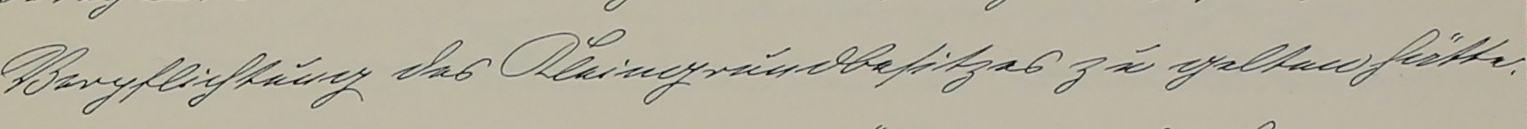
Verpflichtung des Kleingrundbesitzes zu gelten hätte.
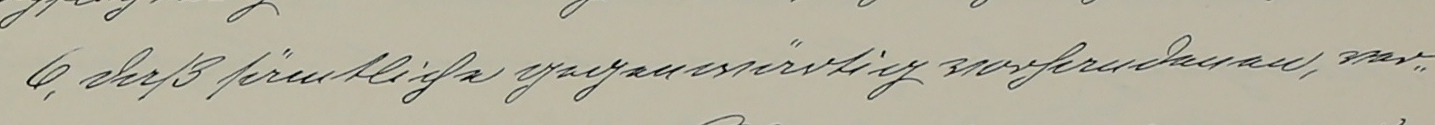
6. daß sämtliche gegenwärtig vorhandenen, ver-
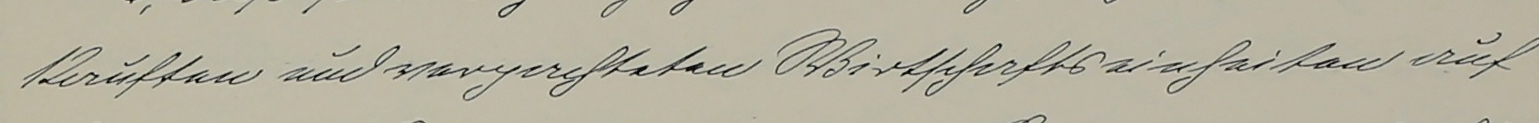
kauften und verpachteten Wirtschaftseinheiten auf
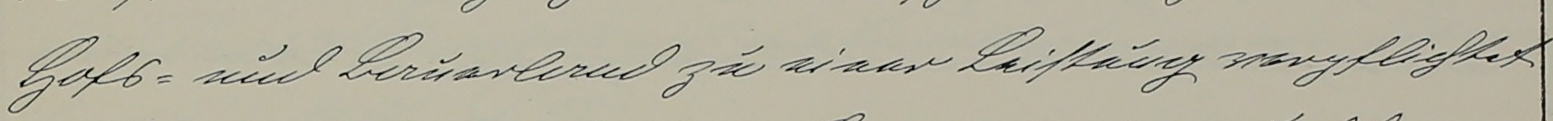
Hofs- und Bauerland zu einer Leistung verpflichtet
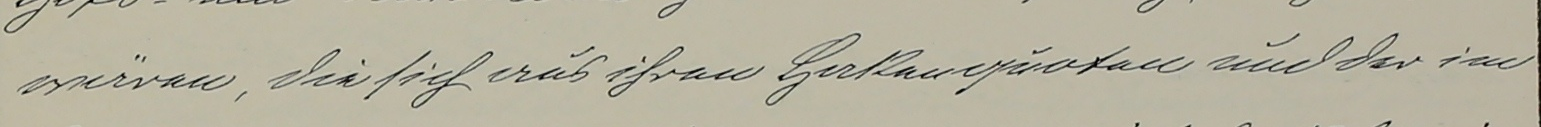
wären, die sich aus ihren Hakenquoten und der im
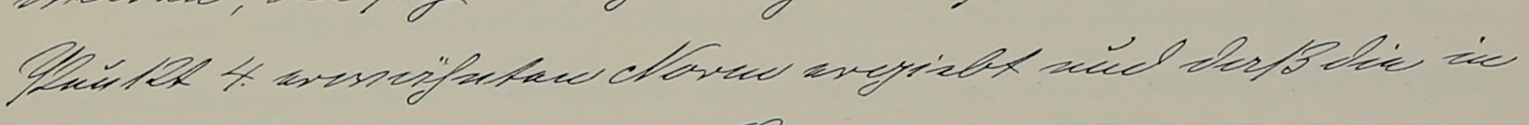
Punkt 4. erwähnten Norm ergiebt und daß die in
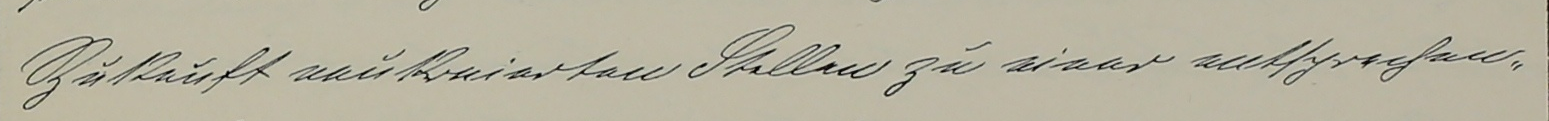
Zukunft neukreierten Stellen zu einer entsprechen-
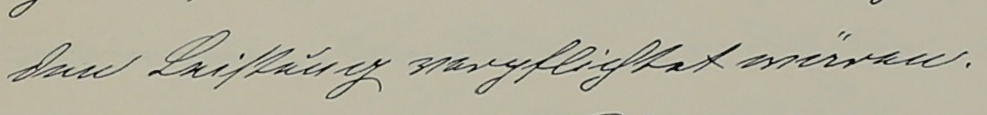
den Leistung verpflichtet wären.
